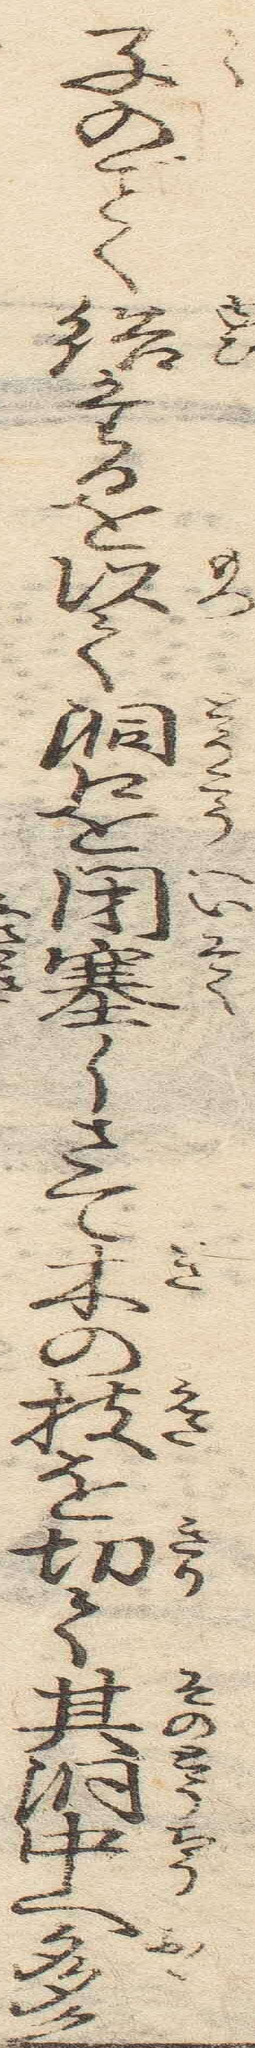子のごとく結たるを以て洞口を閉塞しさて木の枝を切て其洞中へ多く
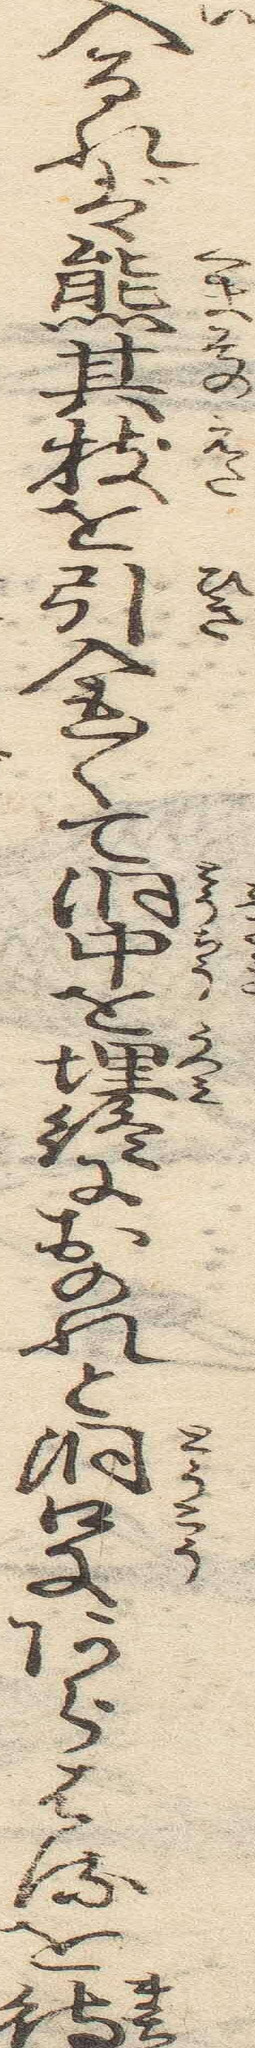入るれば熊其枝を引入れして洞中を埋終におのれと洞口にあらはるを待
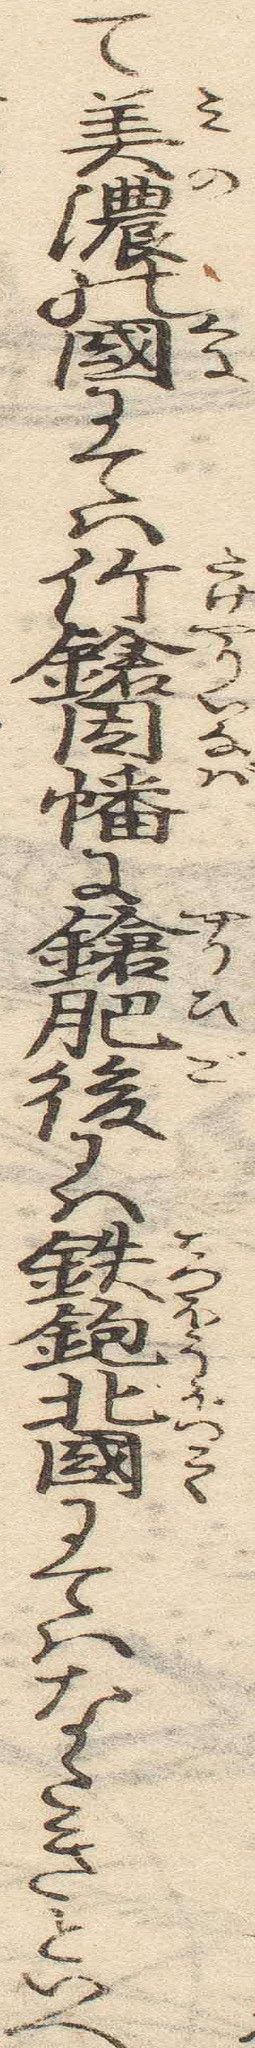て美濃の国にては竹鎗因幡に鎗肥後には鉄炮北国にてはなたきといへ
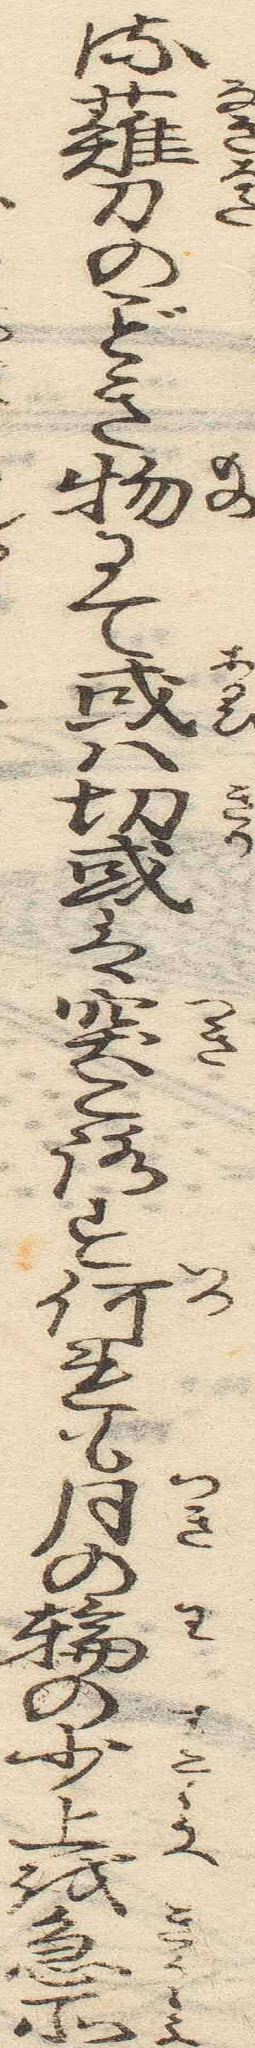る薙刀のごとき物にて或は切或は突ころす何れも月の輪の少上を急所
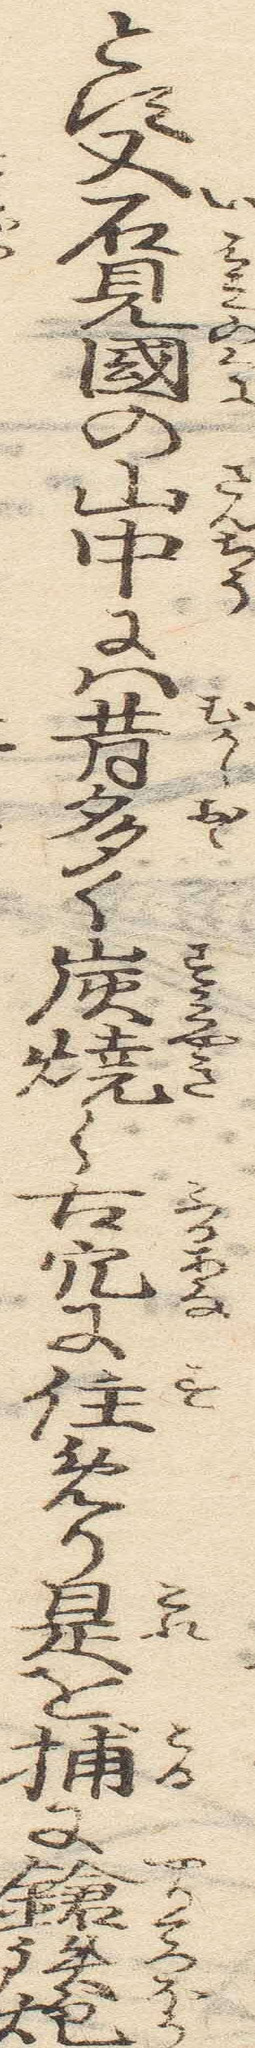とす又石見国の山中には昔多く炭焼し古穴に住めり是を捕に鎗鉄炮
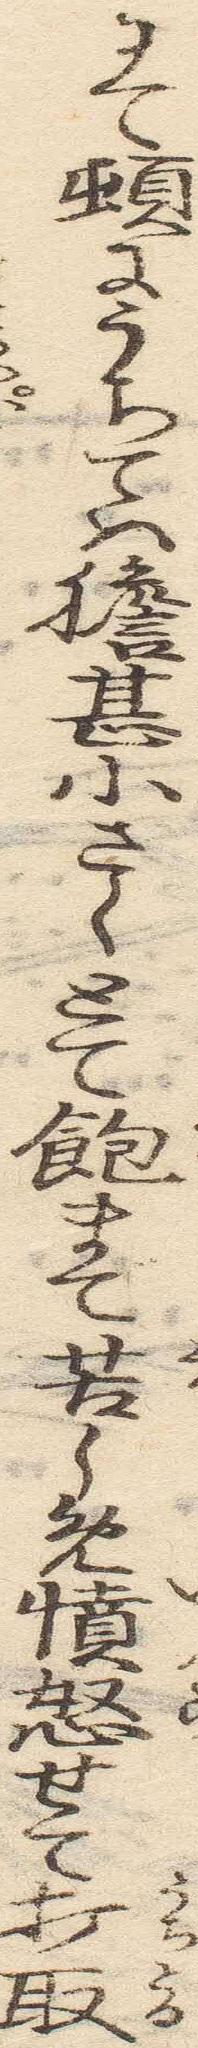にて頓にうちては膽甚小さしとて飽まて苦しめ憤怒せて打取
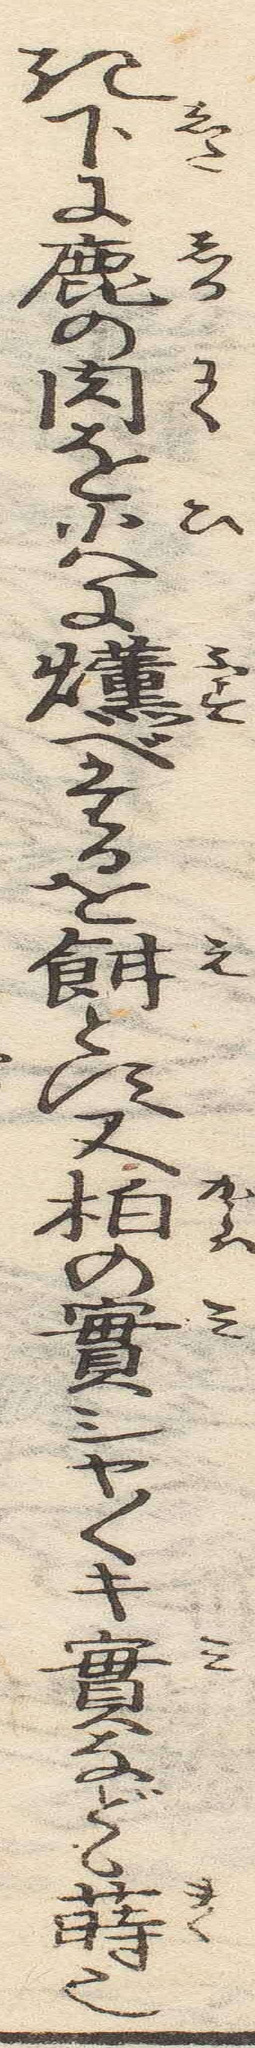き下に鹿の肉を火に燻べたるを餌とす又柏の実シヤ〳〵キ実なども蒔也
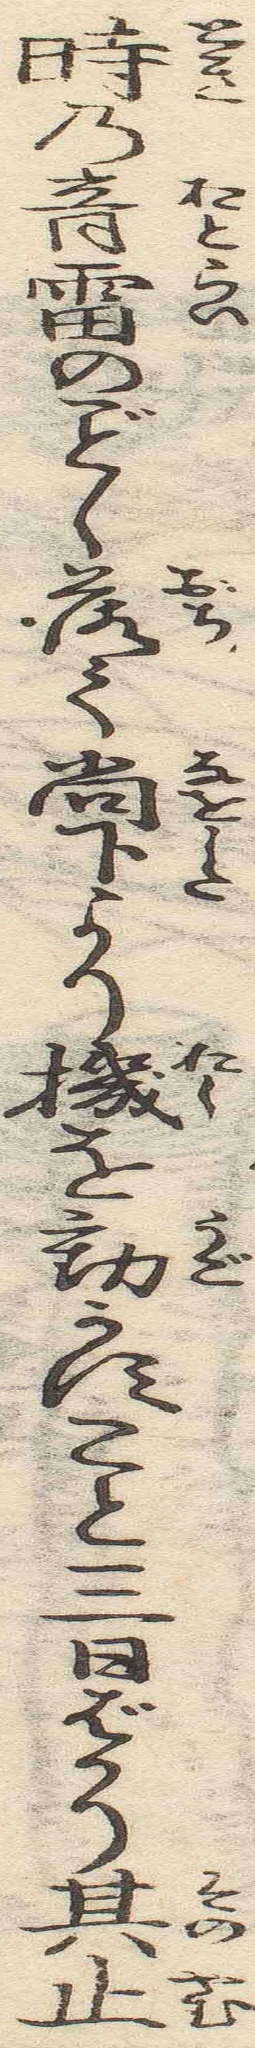時の音雷のごとし落て尚下より機を動かすこと三日ばかり其止
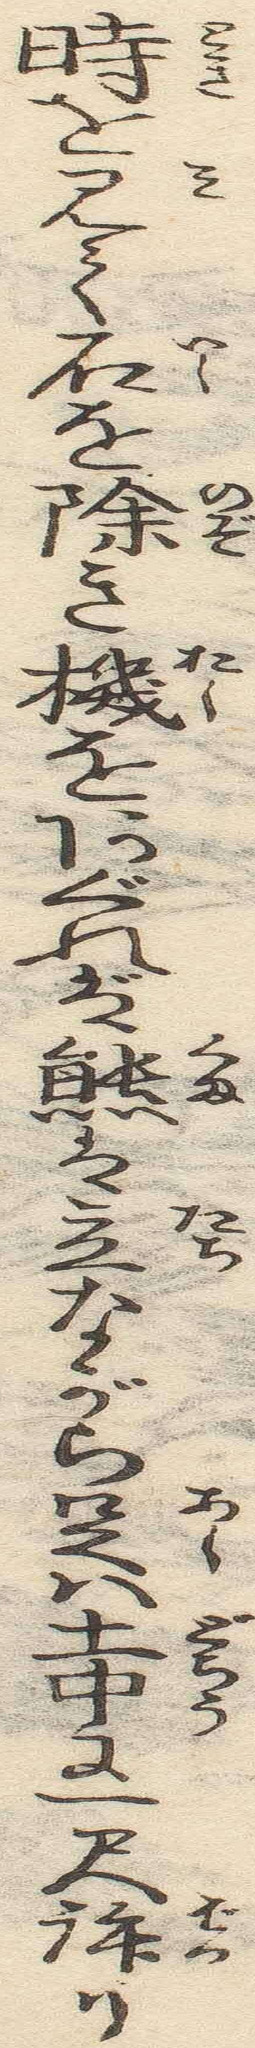時を見て石を除き機をあぐれば熊は立ながら足は土中に一尺許り
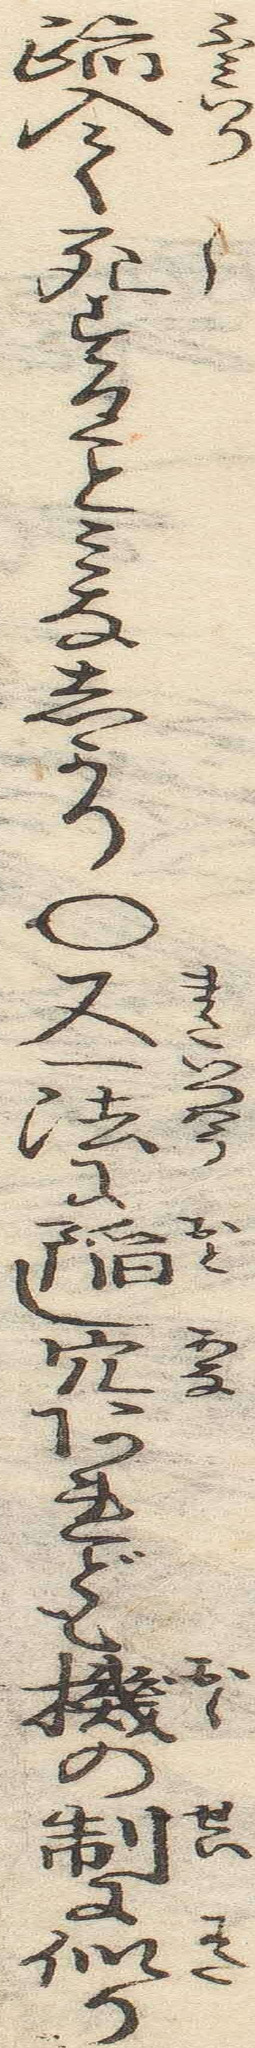跡入て死することみなしかり○又一法に陥し穴あれども機の制に似り
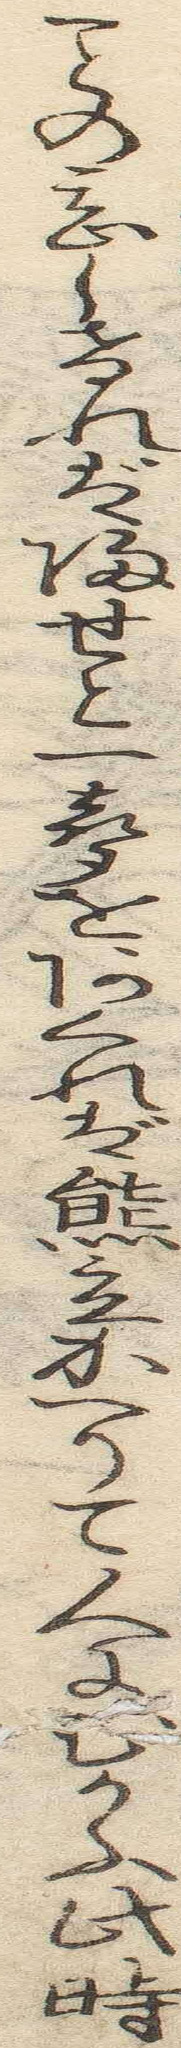ことの甚しければ帰せと一声をあくれば熊立かへりて人にむかふ此時
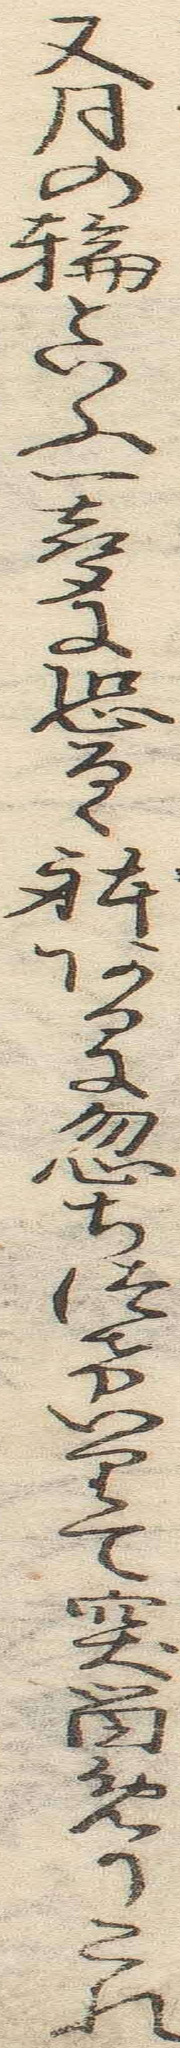又月の輪といふ一声に恐るゝ体あるに忽ちつけいりて突留めりこれ
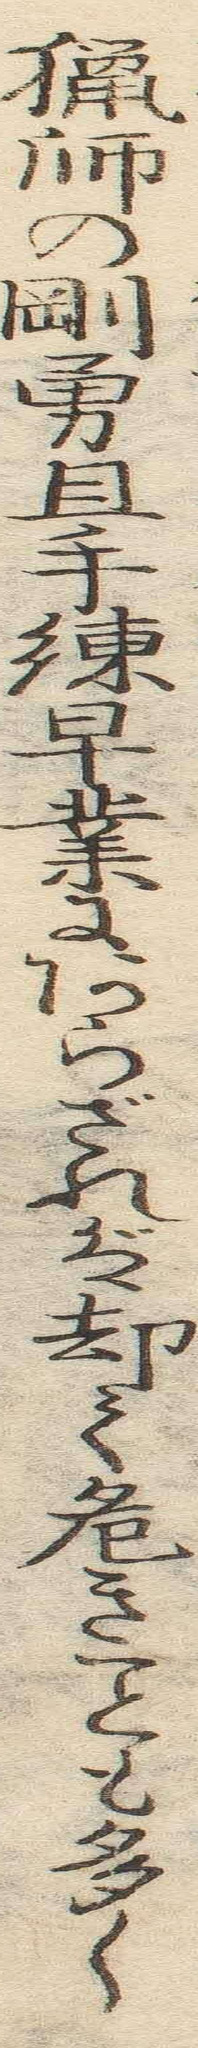猟師の剛勇且手練早業にあらざれば却て危きことも多し
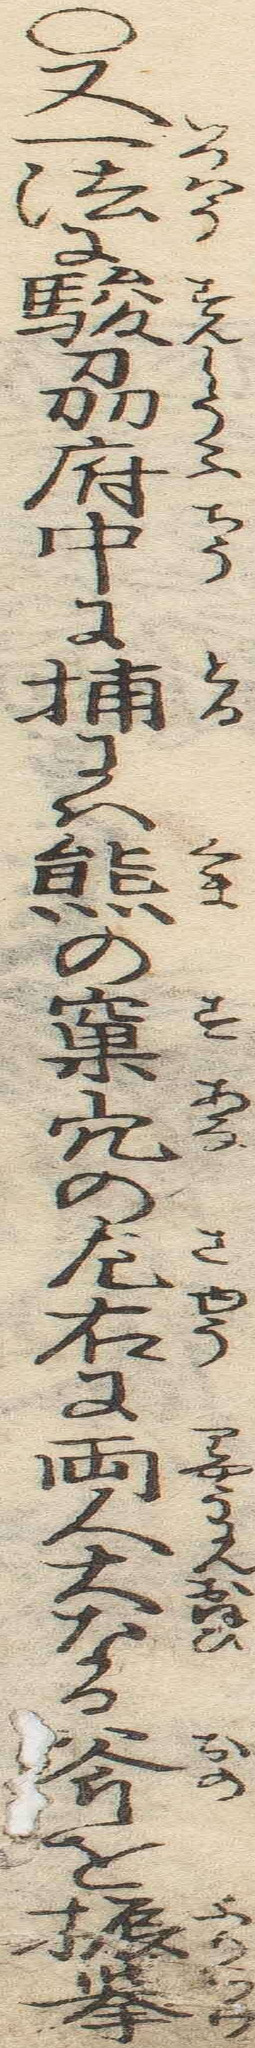○又一法に駿州府中に捕には熊の窠穴の左右に両人大なる斧を振挙
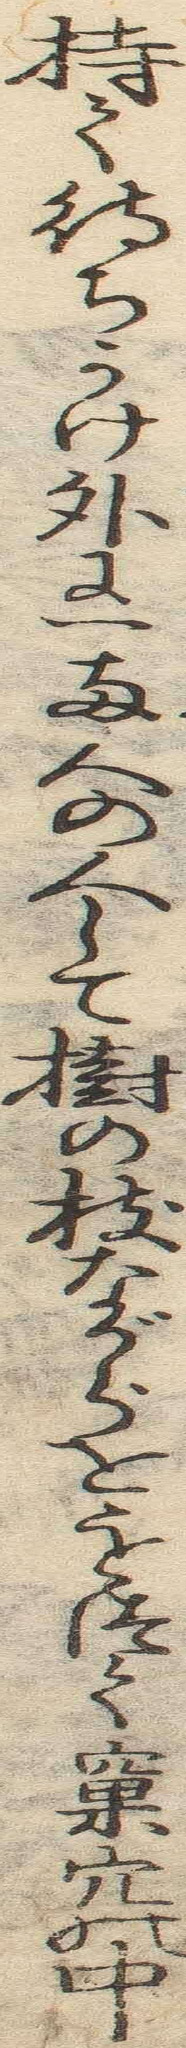持て待ちうけ外に一両人の人して樹の枝ながらをもつて窠穴の中
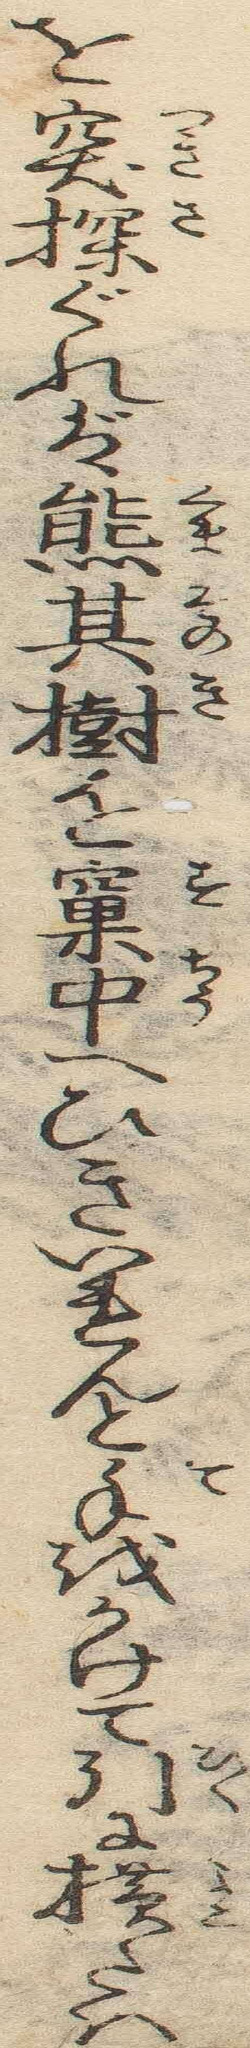を突探ぐれば熊其樹を窠中へひきいれんと手をかけて引に横たは
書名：日本山海名産図会
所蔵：東京学芸大学附属図書館 国文学研究資料館
